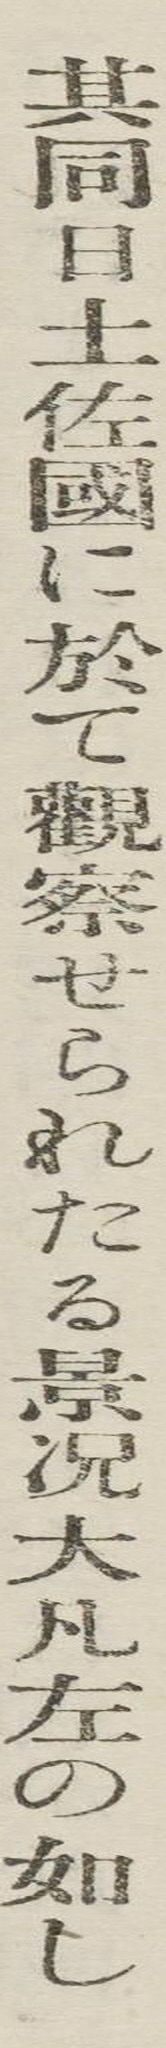其同日土佐国に於て観察せられたる景况大凡左の如し
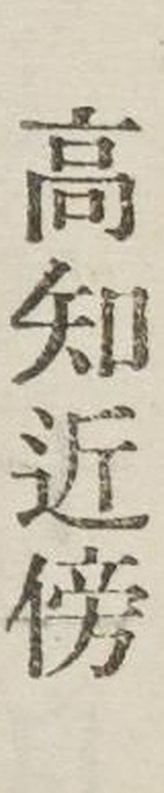高知近傍
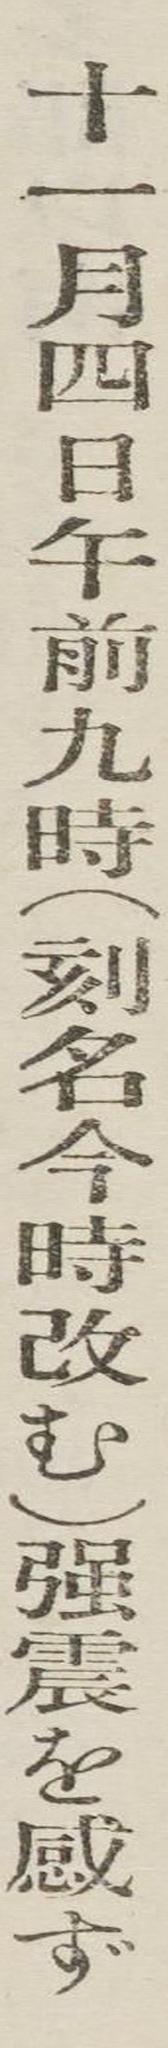十一月四日午前九時強震を感ず
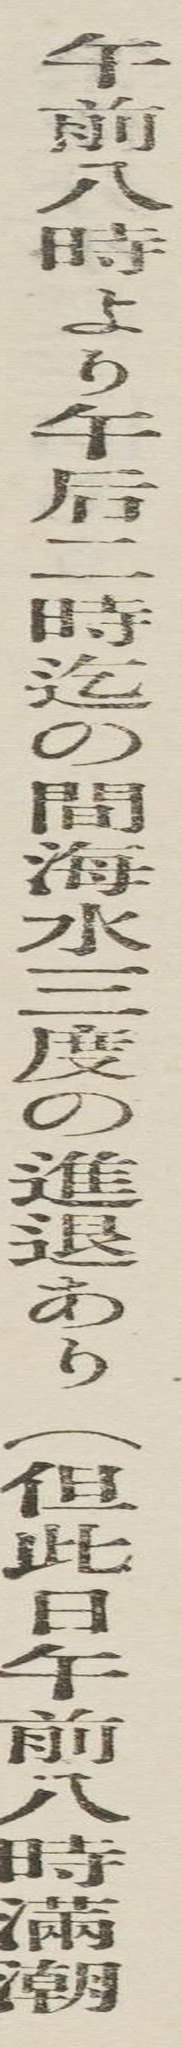午前八時より午后二時迄の間海水三度の進退あり（但此日午前八時満潮

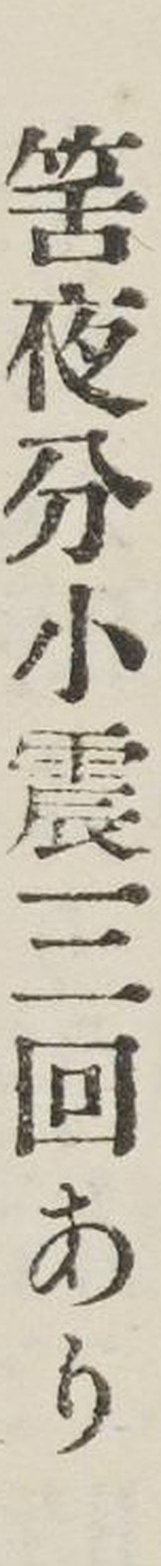筈夜分小震三回あり
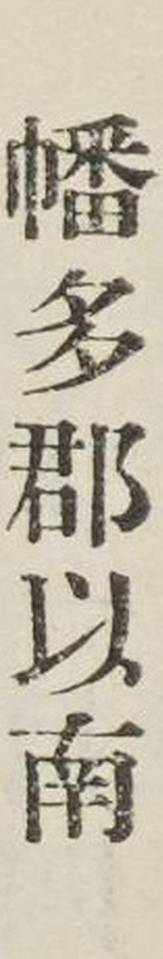幡多郡以南
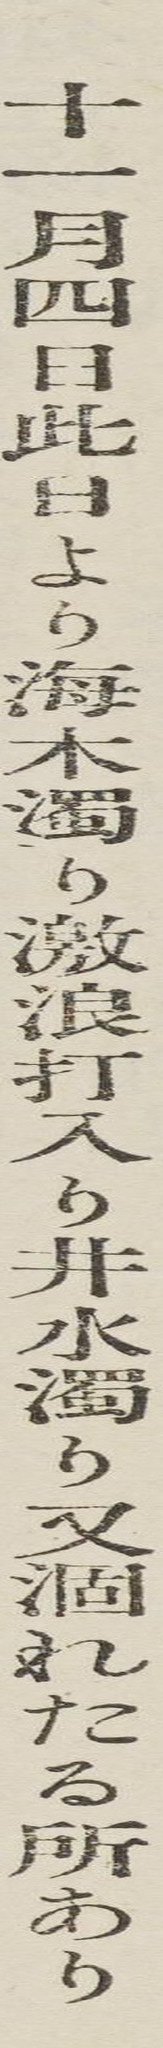十一月四日此日より海木濁り激浪打入り井水濁り又涸れたる所あり
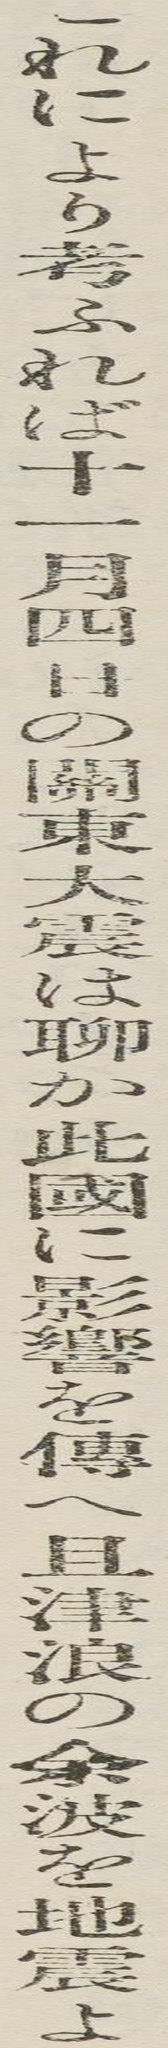これにより考ふれば十一月四日の関東大震は聊か此国に影響を伝へ且津浪の余波を地震よ
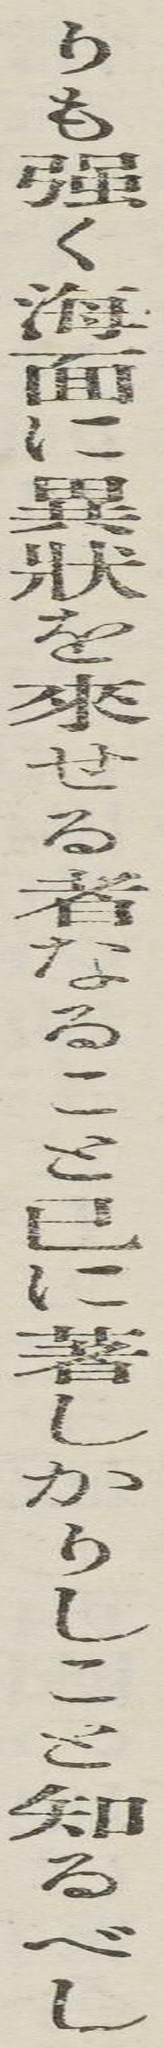りも強く海面に異状を来せる者なること已に著しかりしこと知るべし
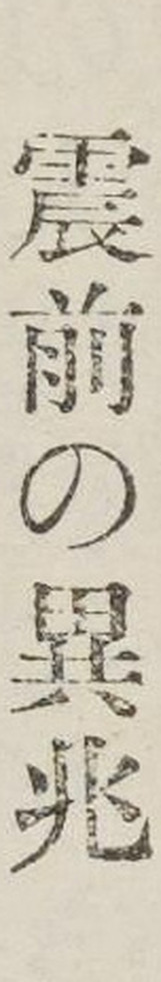震前の異兆
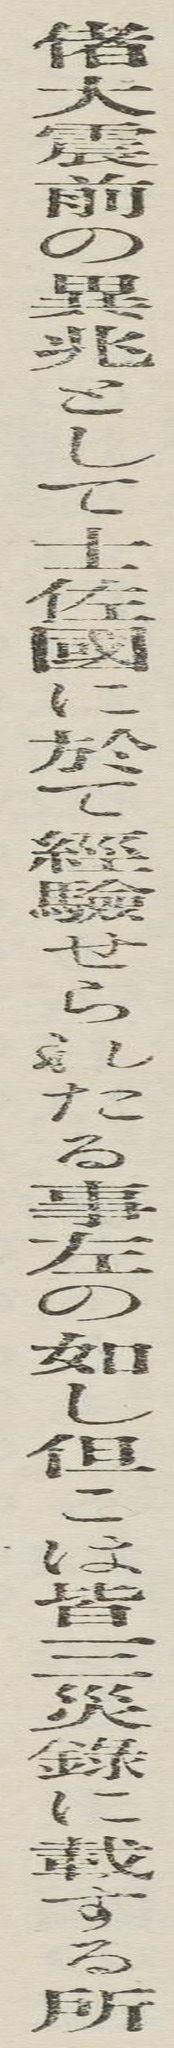偖大震前の異兆として土佐国に於て経験せられたる事左の如し但こは皆三災録に載する所
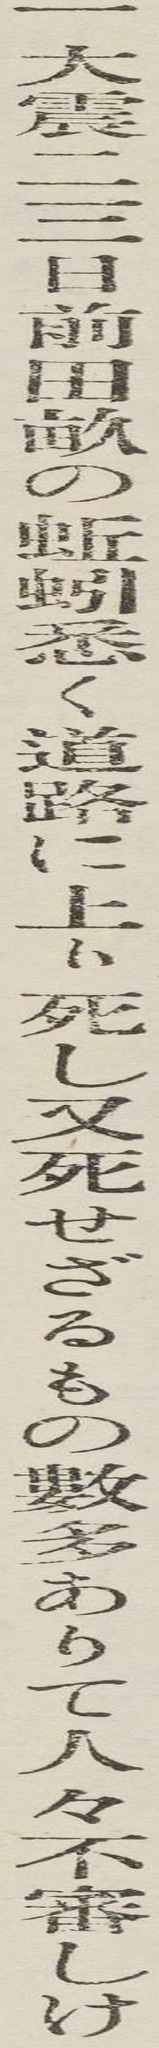㈠大震二三日前田畝の蚯蚓悉く道路に上り死し又死せざるもの数多ありて人々不審しけ
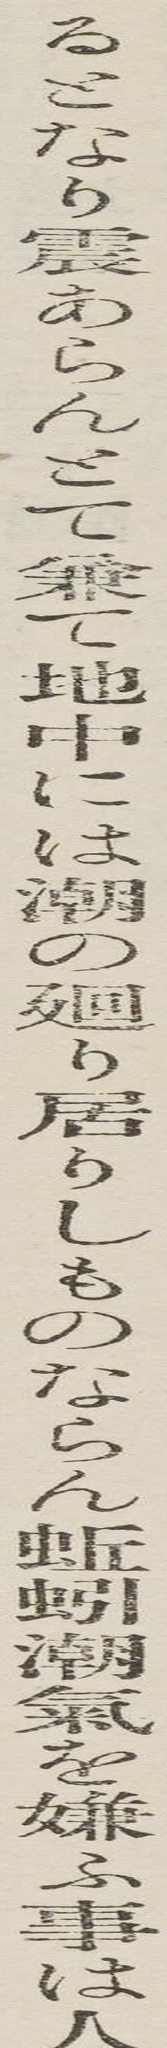るとなり震あらんとて兼て地中には潮の廻り居りしものならん蚯蚓潮気を嫌ふ事は人
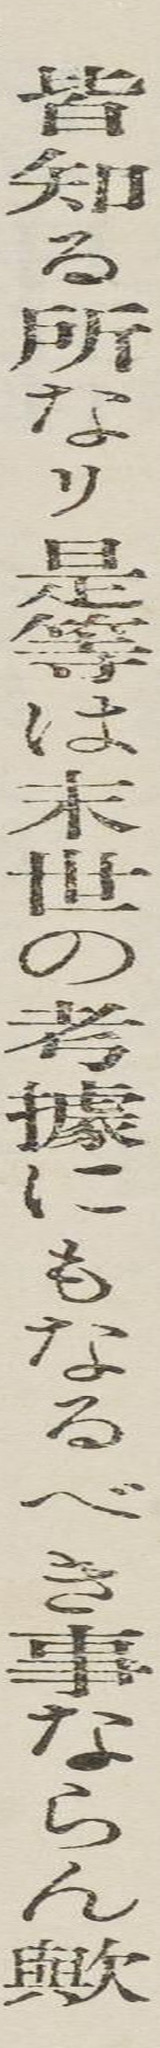皆知る所なり是等は末世の考拠にもなるべき事ならん欤
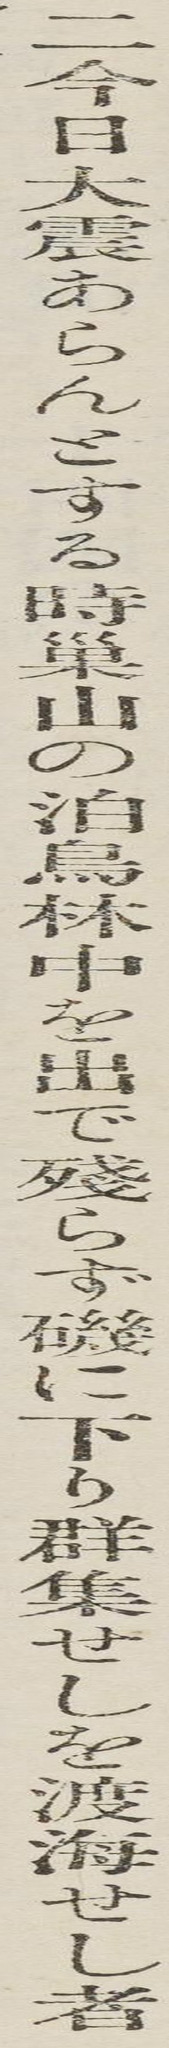㈡今日大震あらんとする時巣山の泊鳥林中を出で残らず磯に下り群集せしを渡海せし者
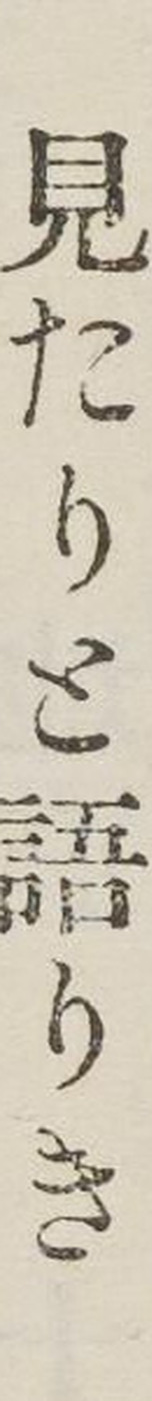見たりと語りき
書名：土佐古今ノ地震
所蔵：東京大学地震研究所図書室 Earthquake Research Institute Library, The University of Tokyo, JAPAN
